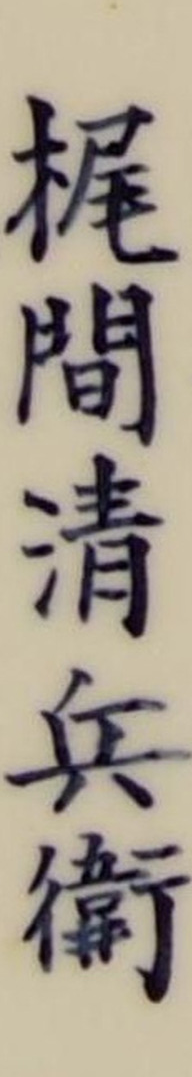梶間清兵衛
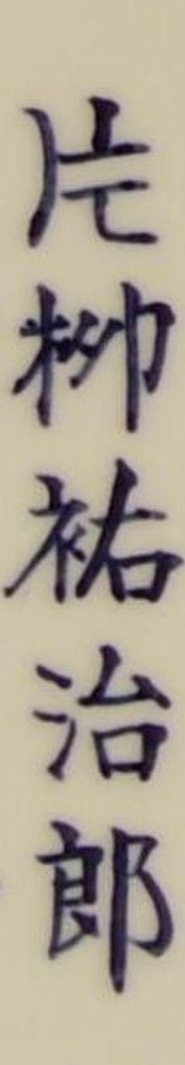片柳祐治郎
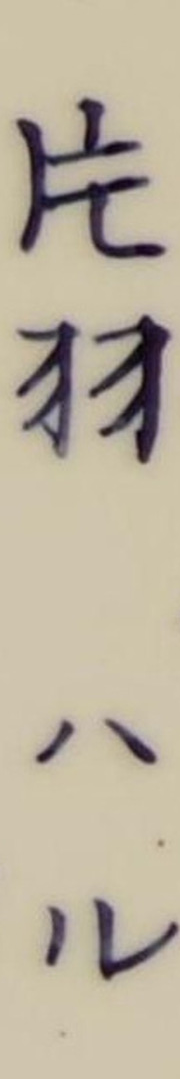片羽ハル
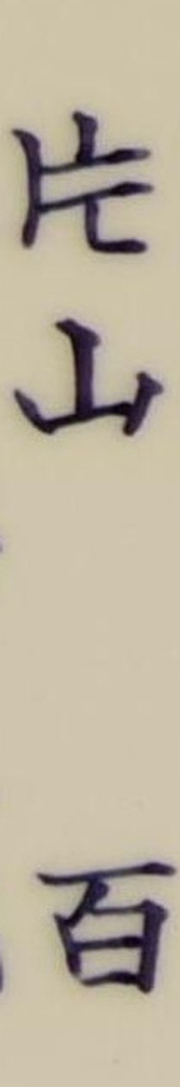片山百
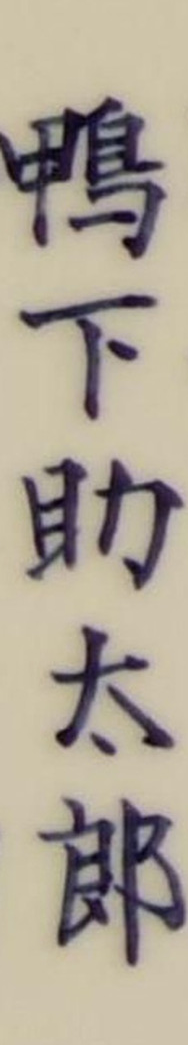鴨下助太郎

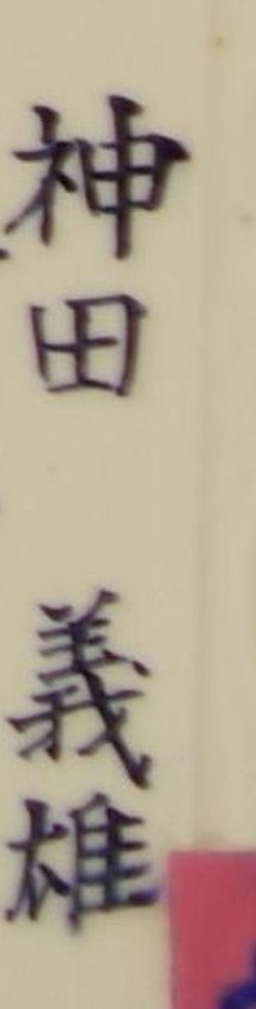神田義雄
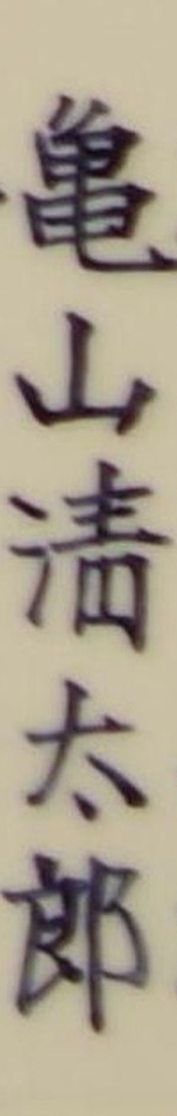亀山清太郎
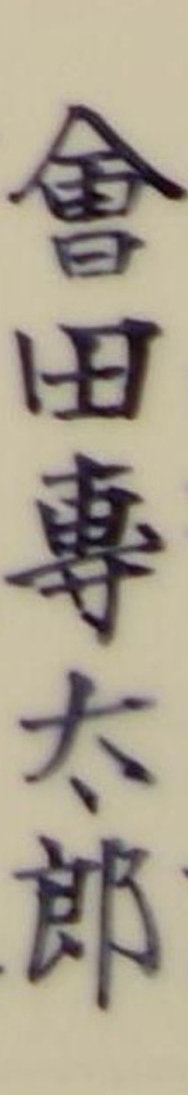会田専太郎
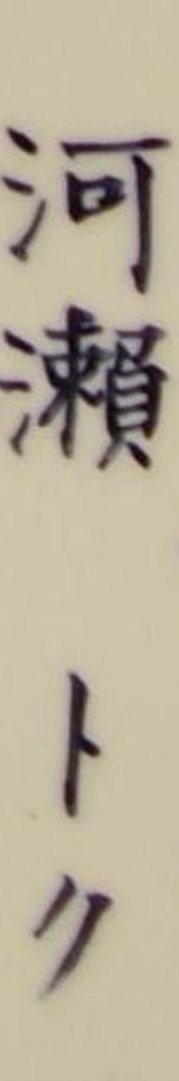河瀬トク
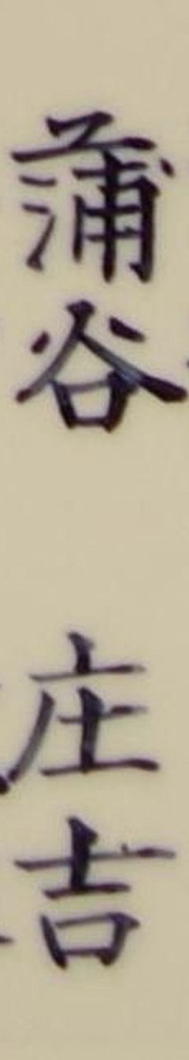蒲谷庄吉
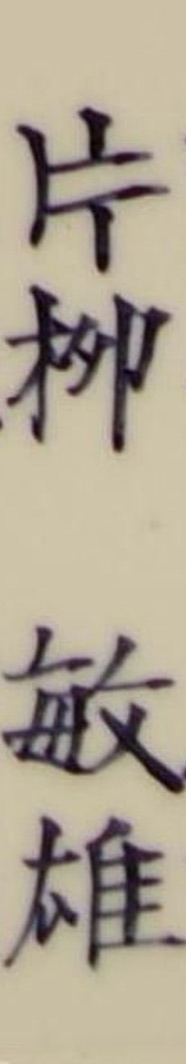片柳敏雄
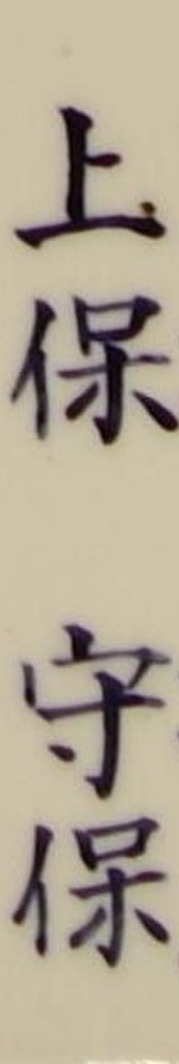上保守保
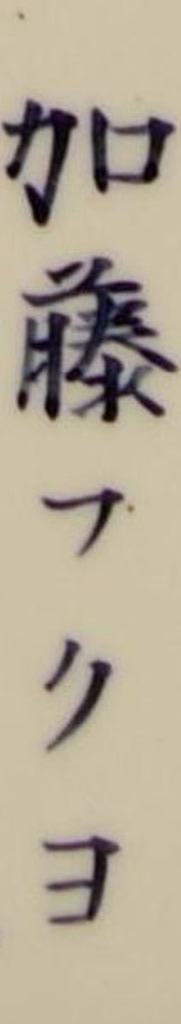加藤フクヨ
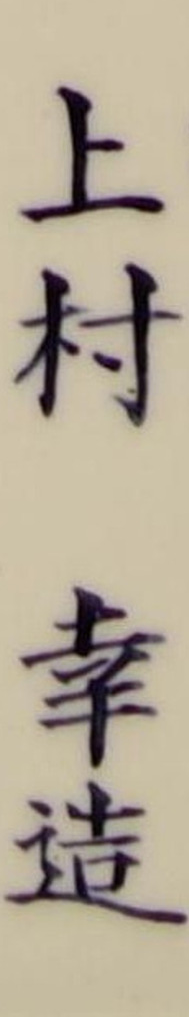上村幸造
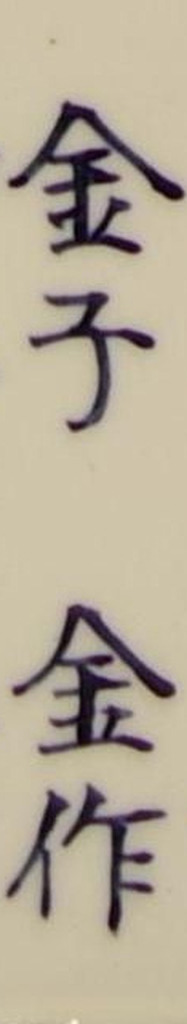金子金作
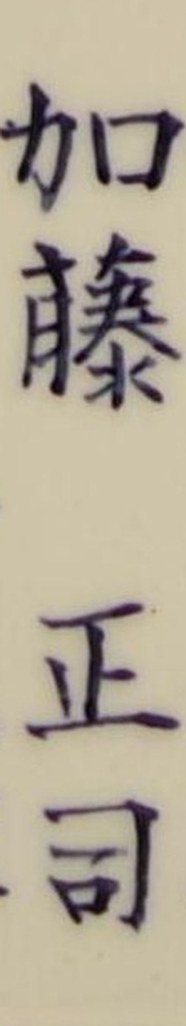加藤正司
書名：E~L
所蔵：高野山金剛峯寺
